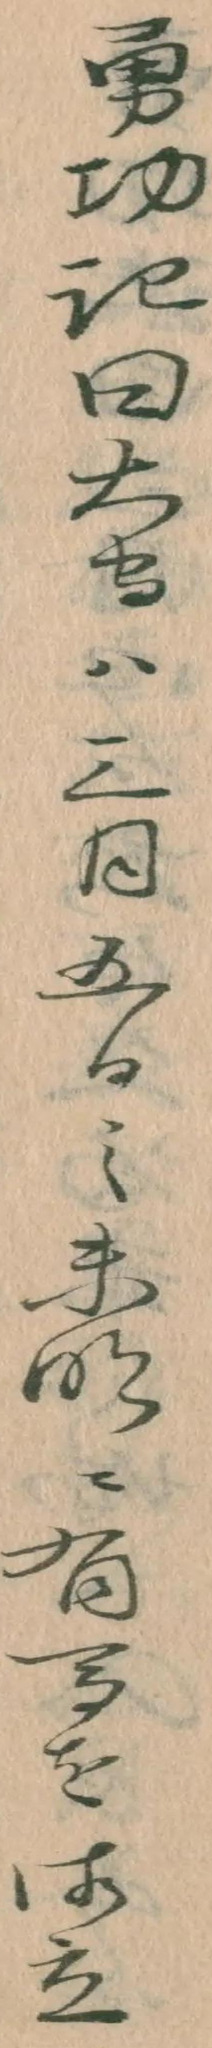勇功記曰大守は三月五日之未明に有馬を御立
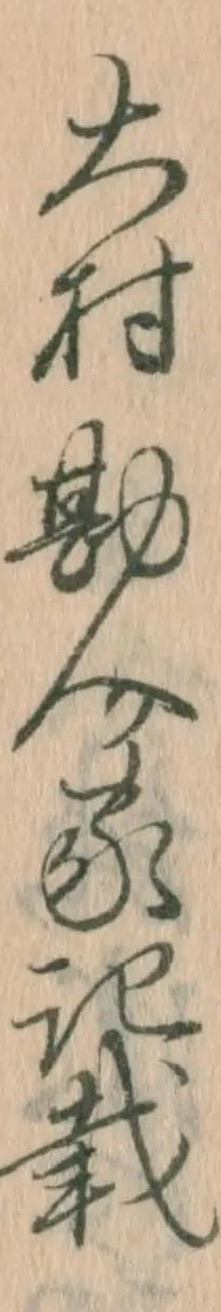大村勘介家記載
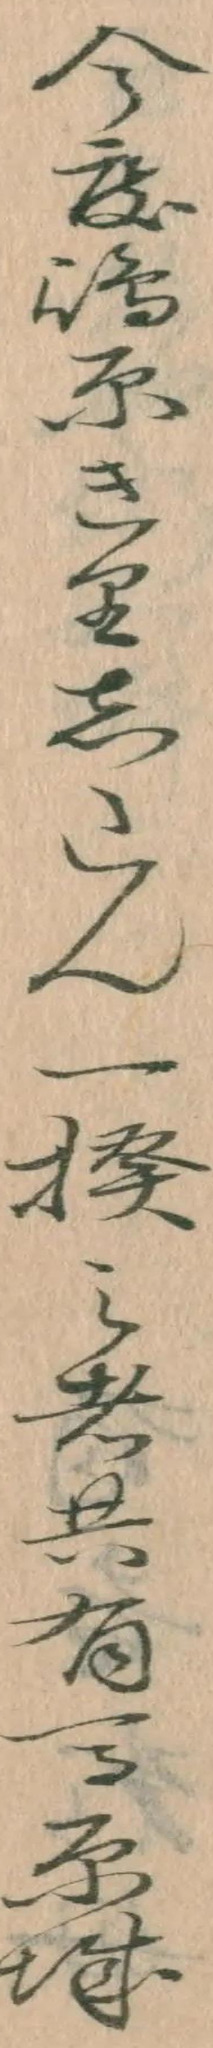今度島原き里志たん一揆之者共有馬原城
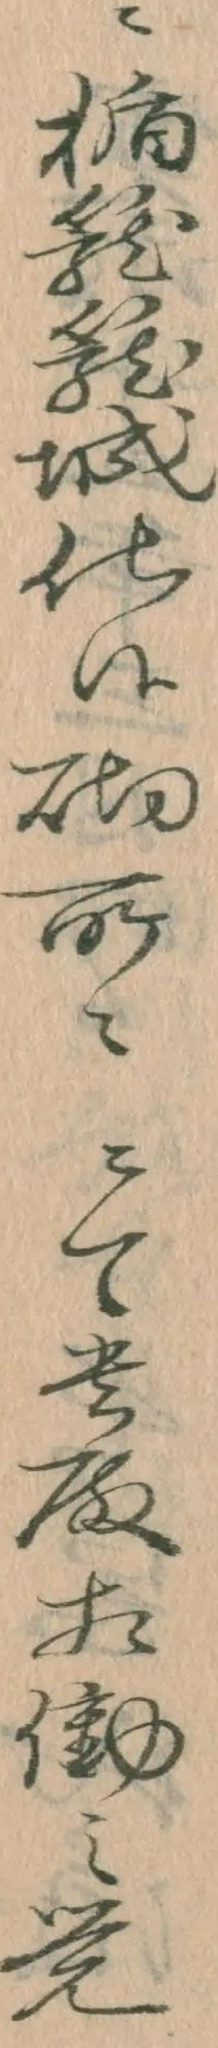に楯籠籠城仕候砌所々にて貴殿相働之覚
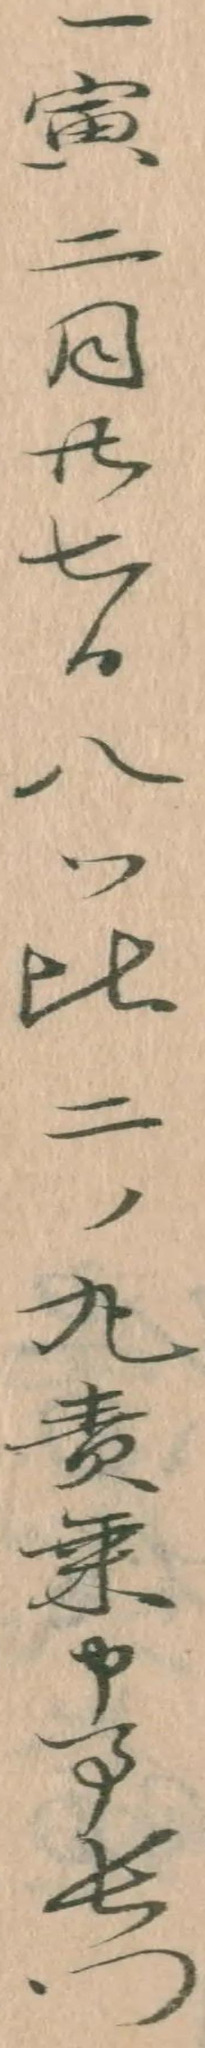一寅二月廿七日八つ比二之丸責乗申事長門
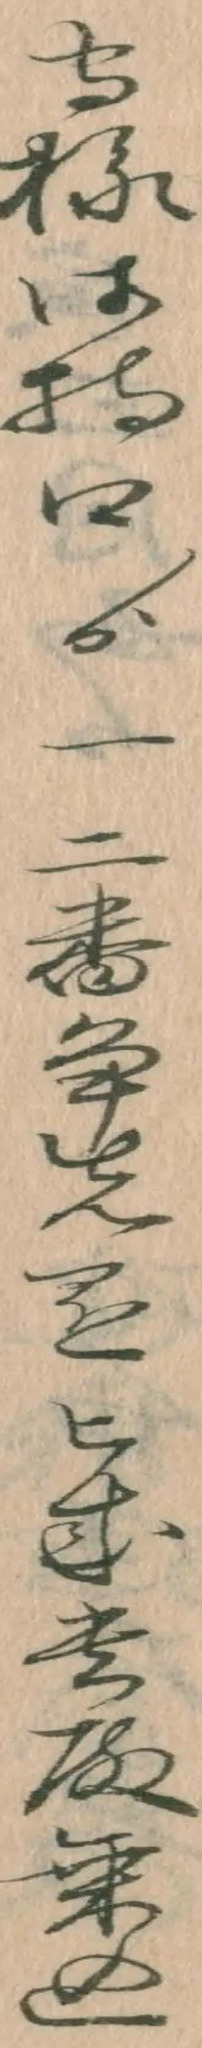守様御持口ゟ一二番争先懸被成貴殿乗込
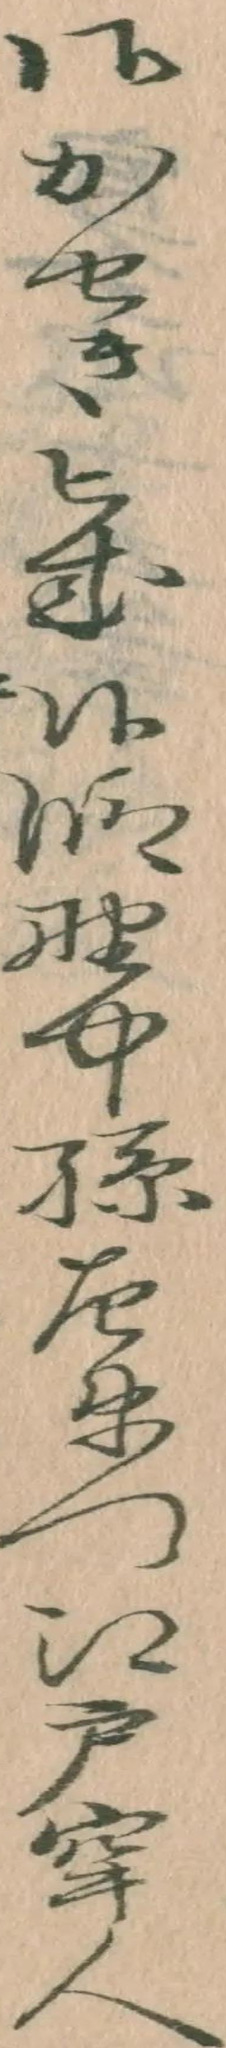御加せき被成候段の中孫左衛門江戸牢人
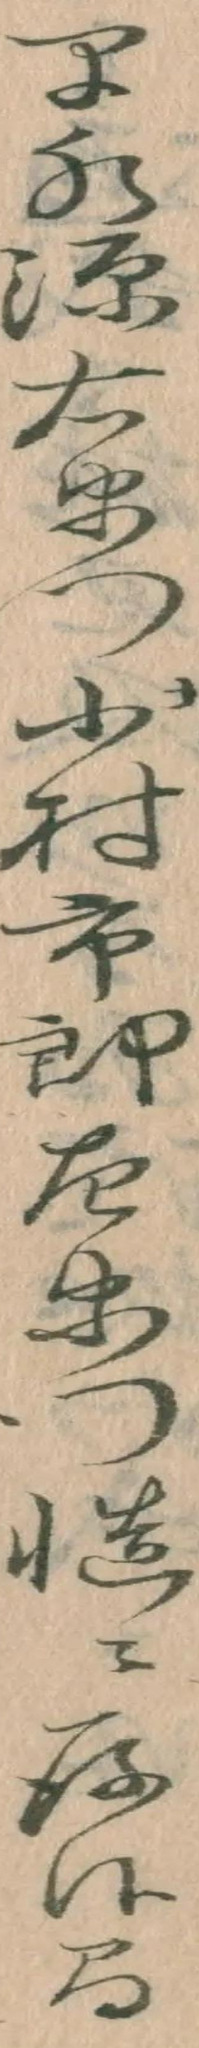早水源右衛門小村市郎左衛門慥に存候間
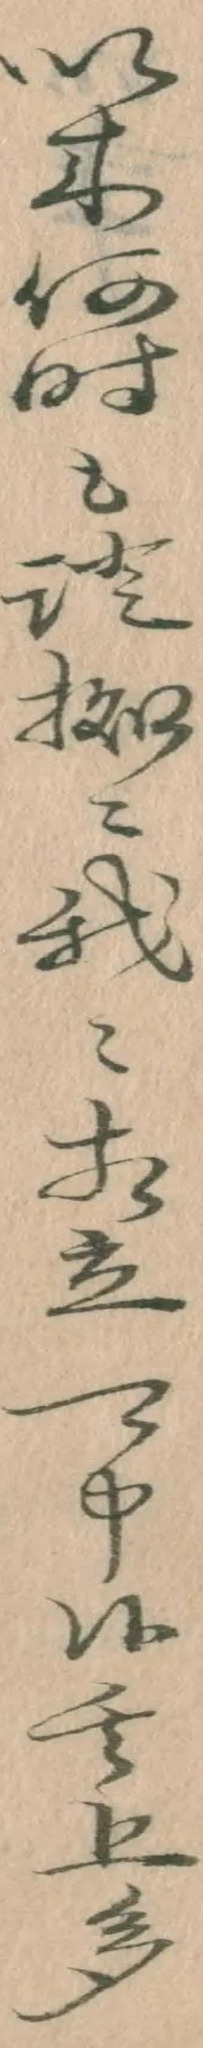以来何時も證拠に我に相立可申候其上多
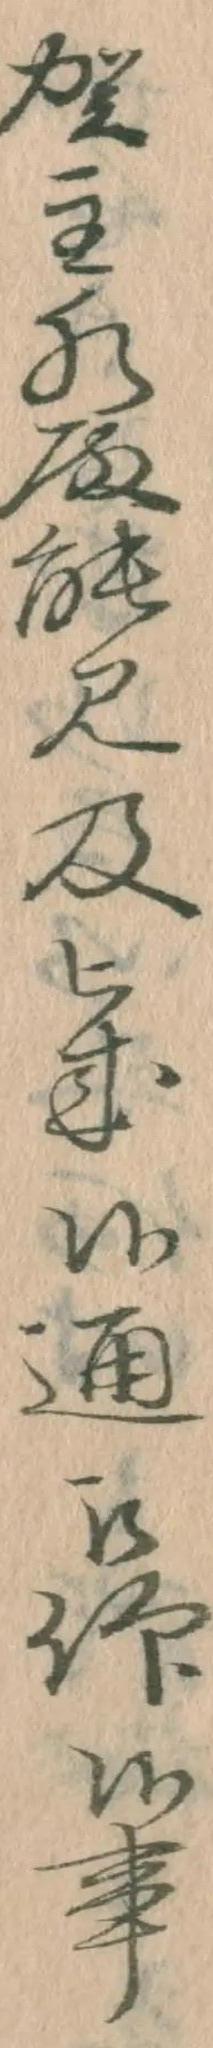賀主水殿能見及被成候通被仰候事
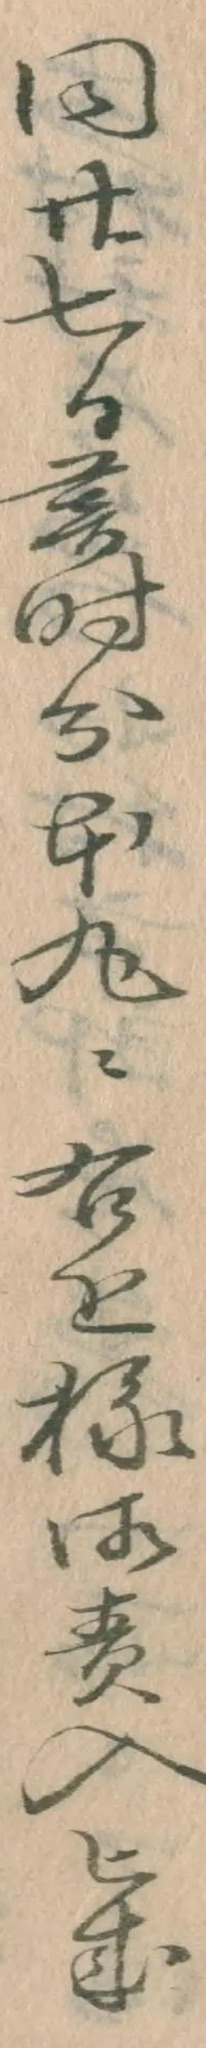一同廿七日暮時分本丸に右近様御責入被成
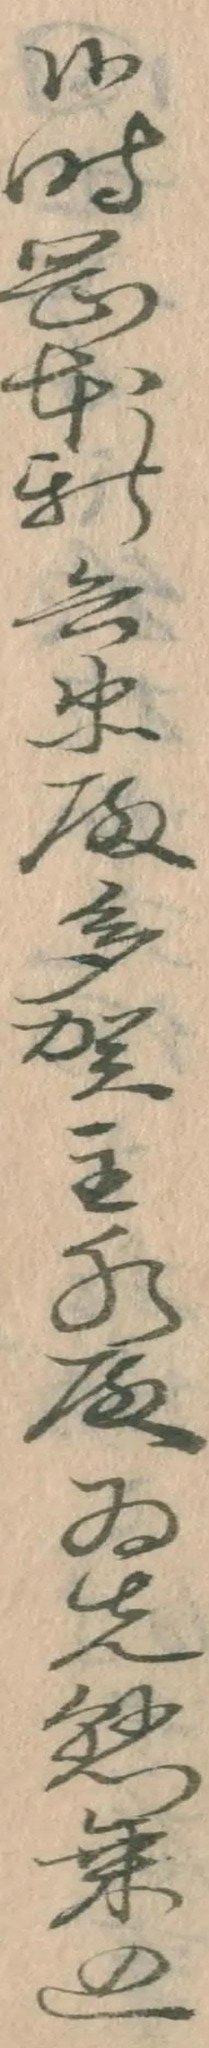候時岡本新兵衛殿多賀主水殿ゐ先懸乗込
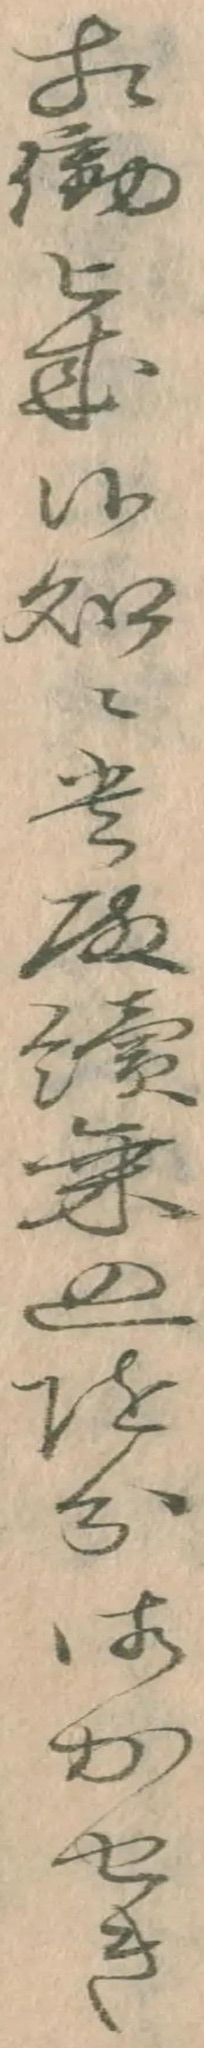相働被成候処に貴殿続乗込随分御加せき
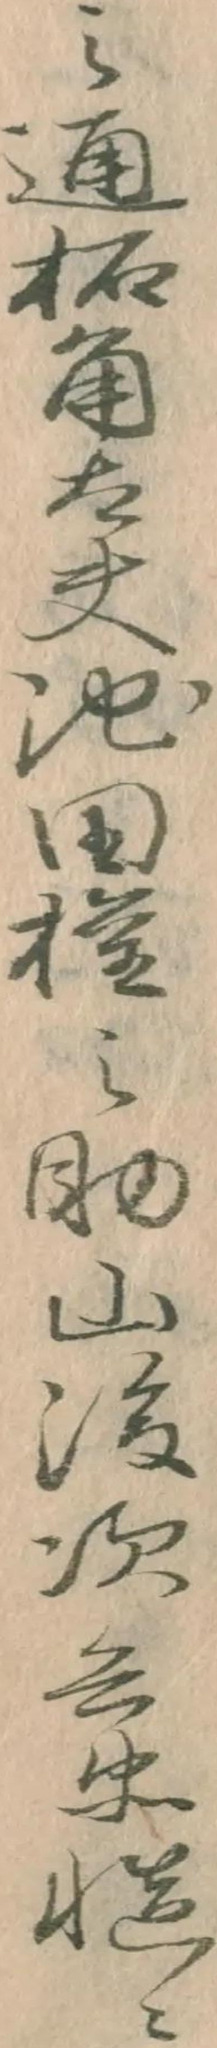之通柘角太夫池田権之助山後次兵衛慥に

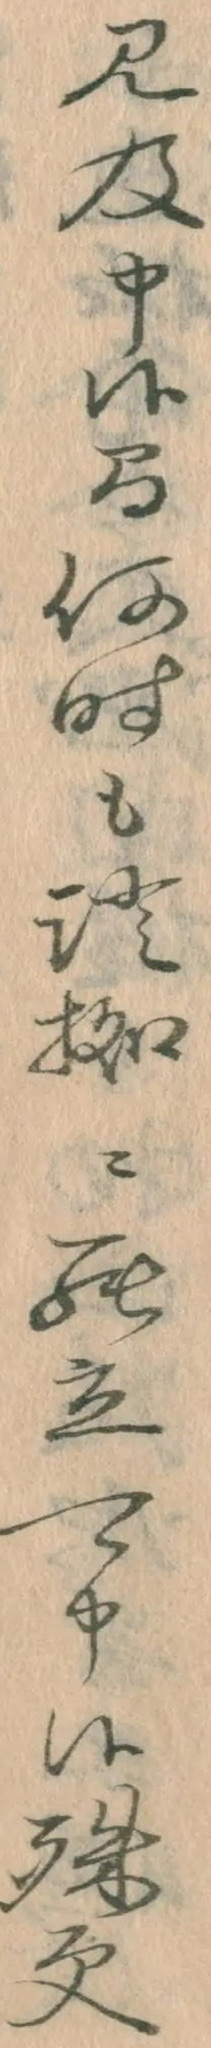見及申候間何時も證拠に罷立可申候殊更
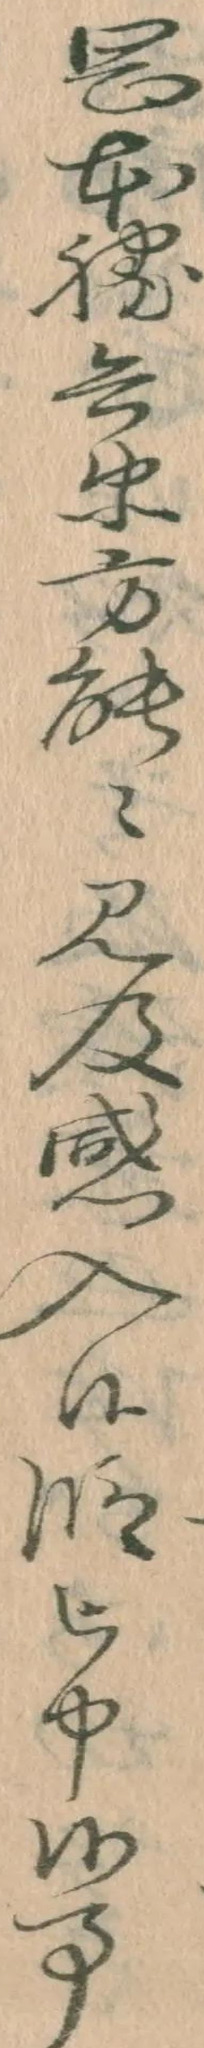岡本勝兵衛方能に見及感入候段被申候事
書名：切支丹御退治記 49巻. [9]
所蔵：国立国会図書館 National Diet Library, JAPAN
